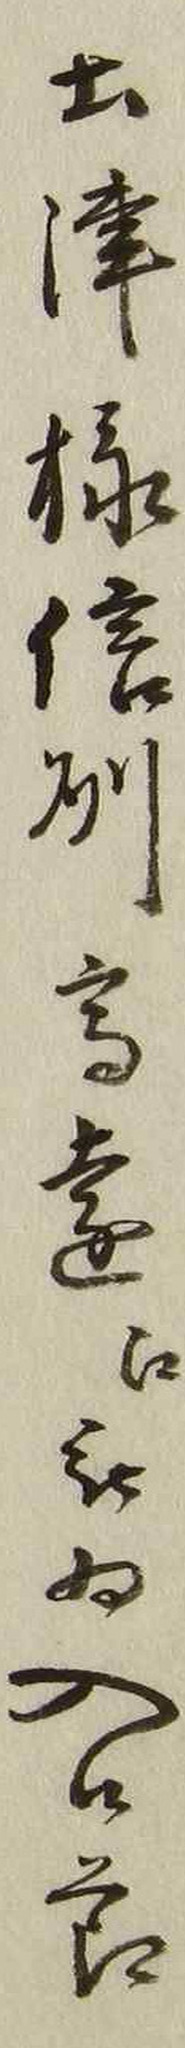土津様信州高遠江被為入候節
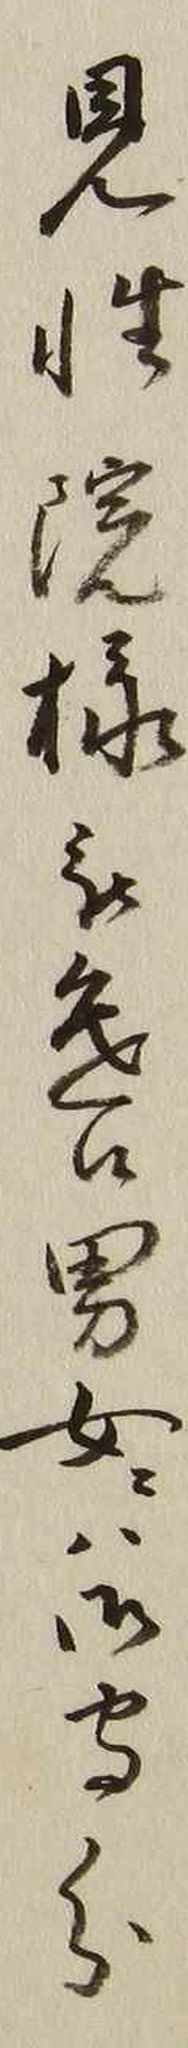見性院様被遣候男女ニハ御守分
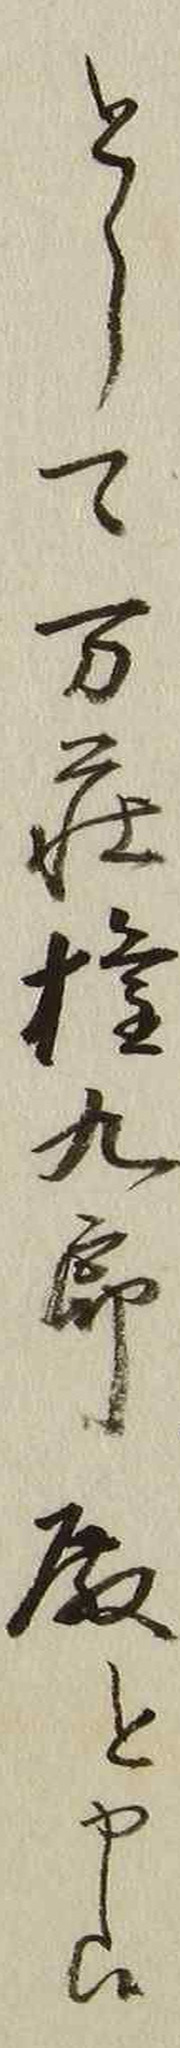として万荘権九郎殿と申候
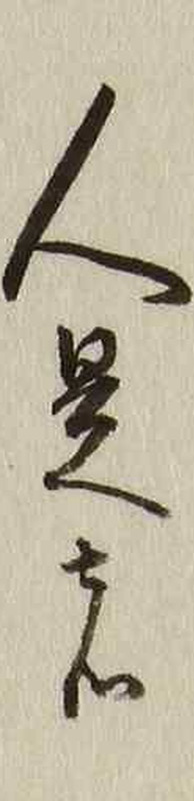人是者
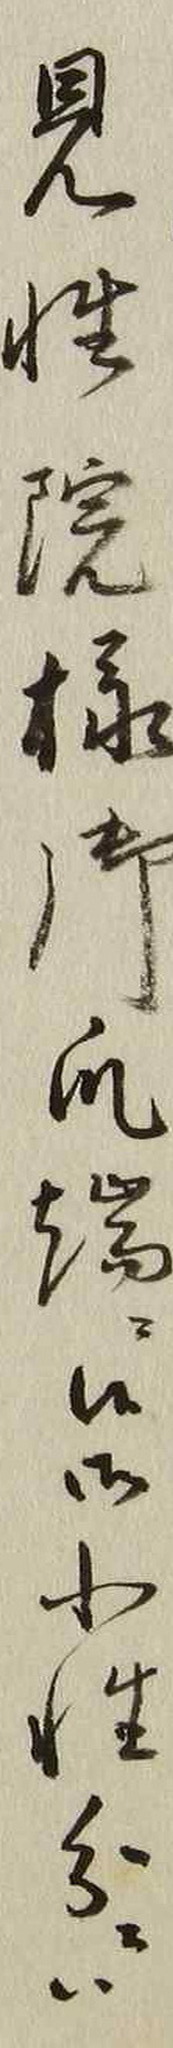見性院様御爪端候ニ候御小性分ニハ
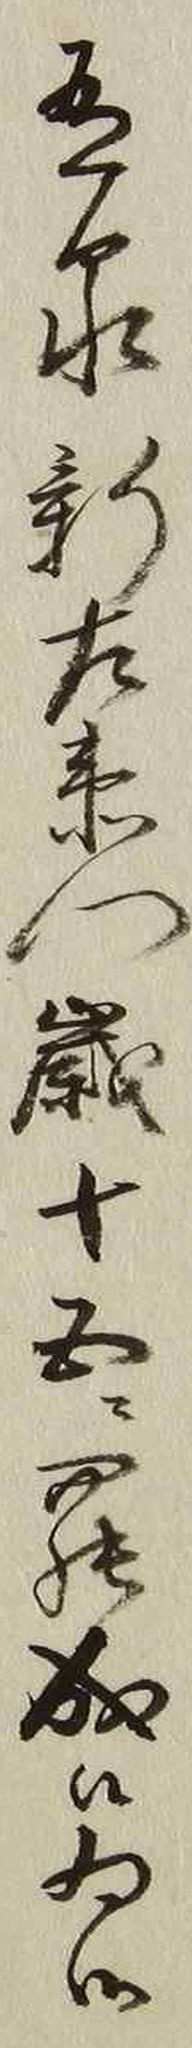有泉新左衛門歳十五ニ罷成候為御
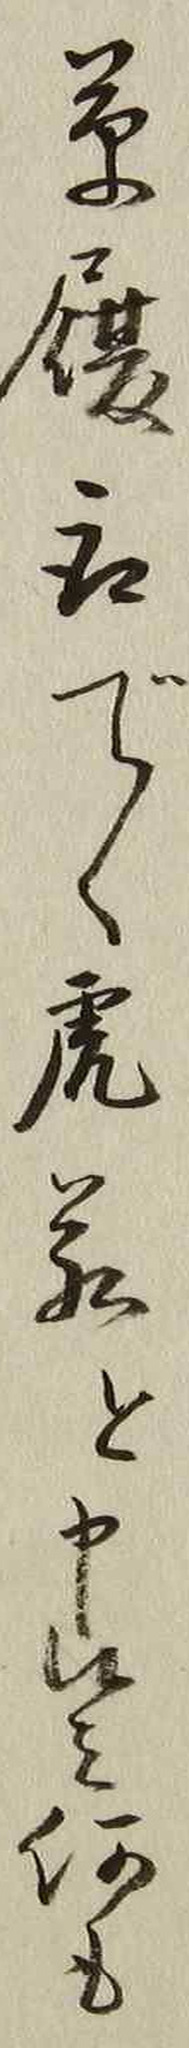草履取でく虎若と申候者何も
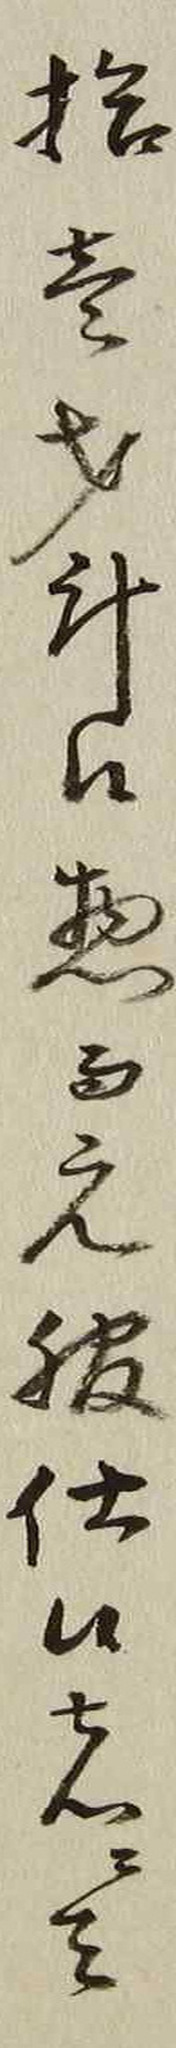拾壱才計候惣而元服仕候者ニ者
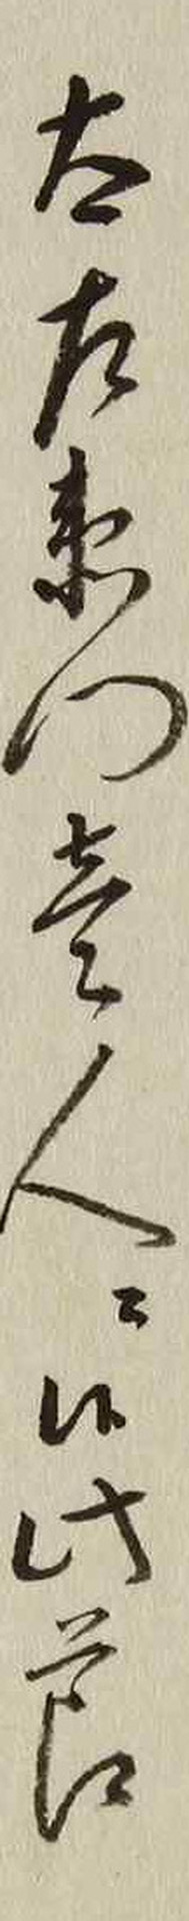太左衛門壱人ニ候此節
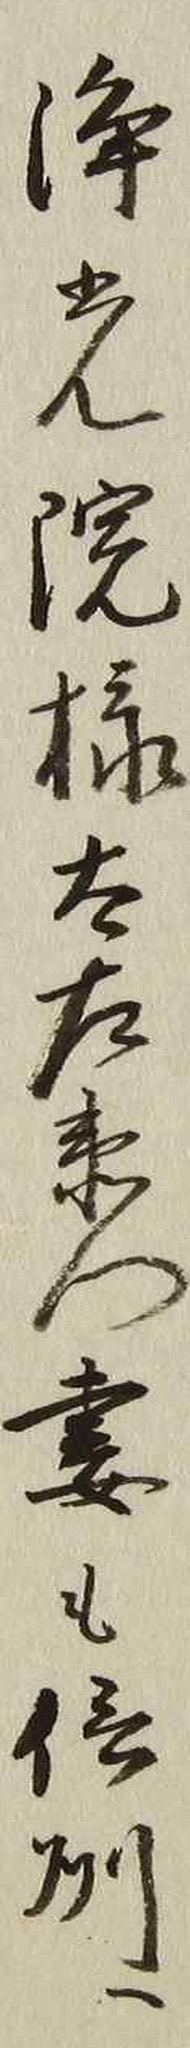浄光院様太左衛門妻も信州へ
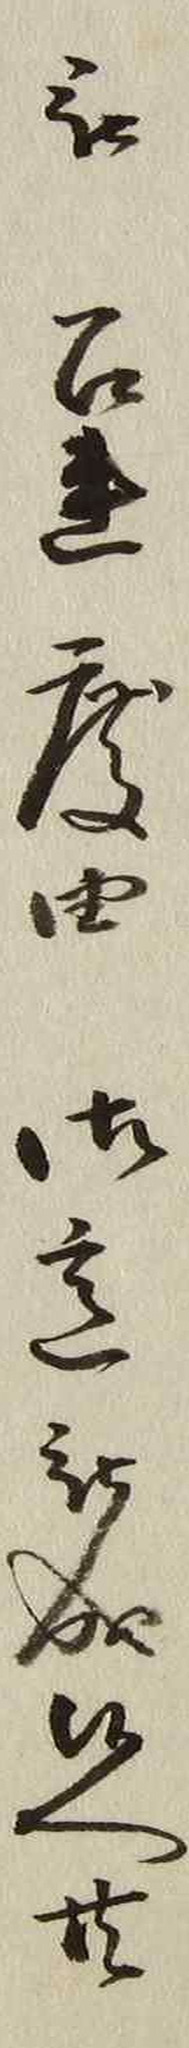被召連度由御意被成候へ共
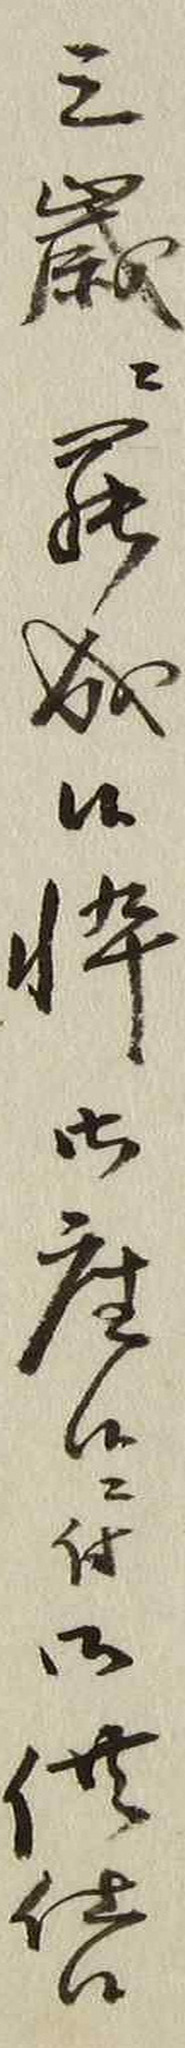三歳ニ罷成候忰御座候ニ付御供仕候
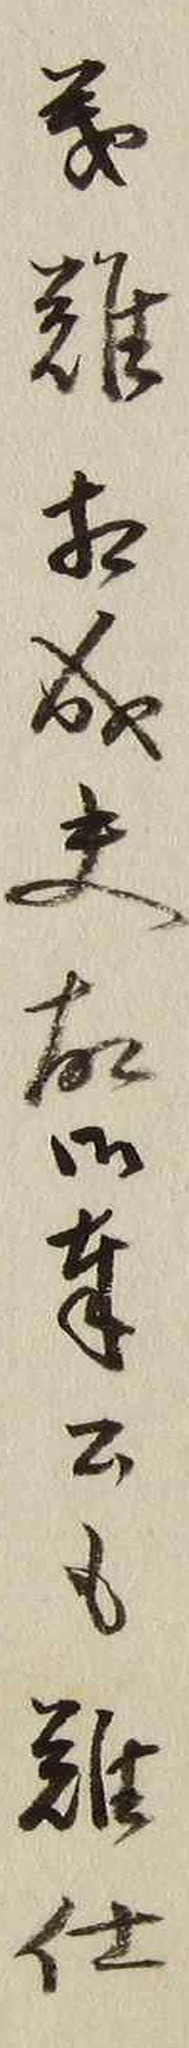義難相成夫故御奉公も難仕
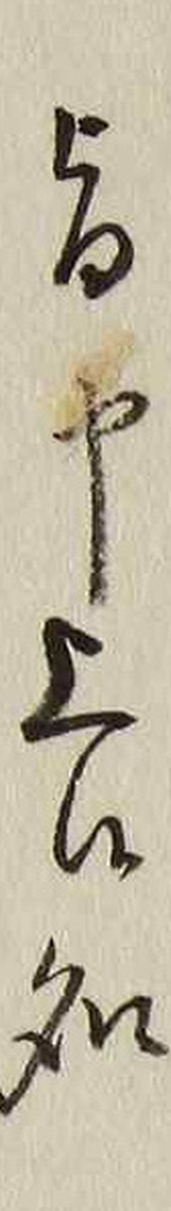旨申上候処
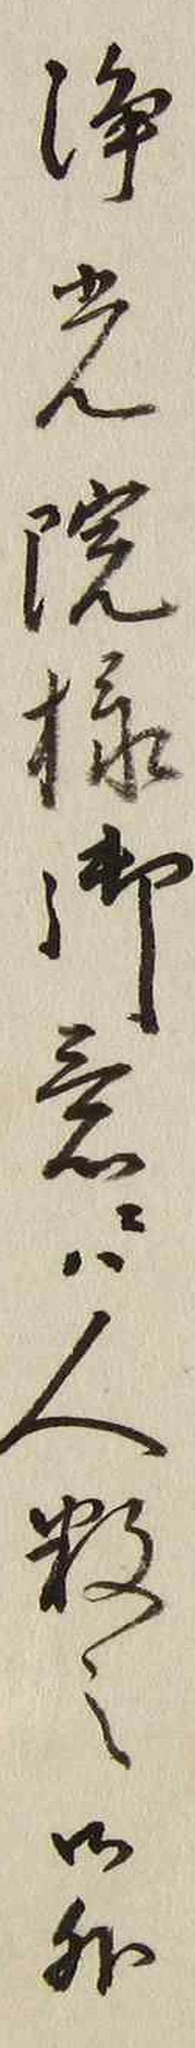浄光院様御意ニハ人数之御外
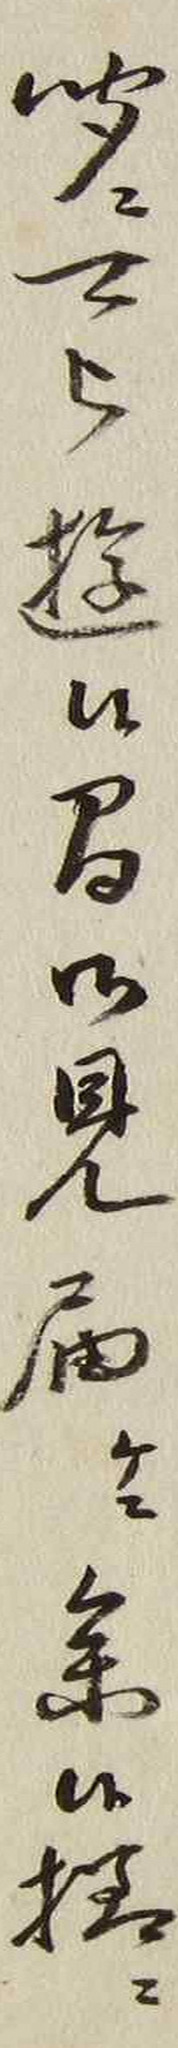聞ニ可被遊候間御見届ケニ参候様ニ
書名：諸士系譜　巻之149　そ之部2
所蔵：会津若松市立会津図書館
